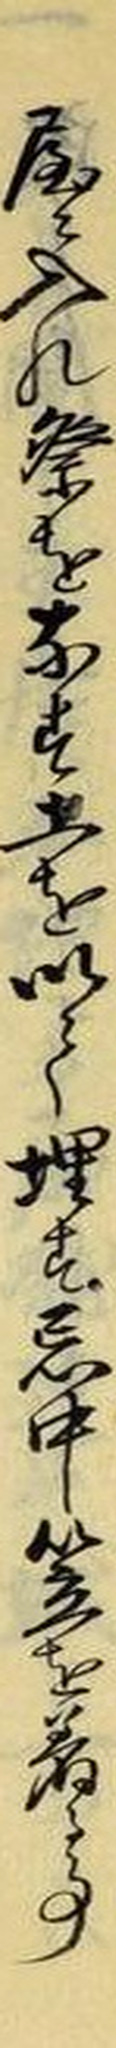屋ニ入れまつ祭をなす土を以て埋す忌中笠を着る事
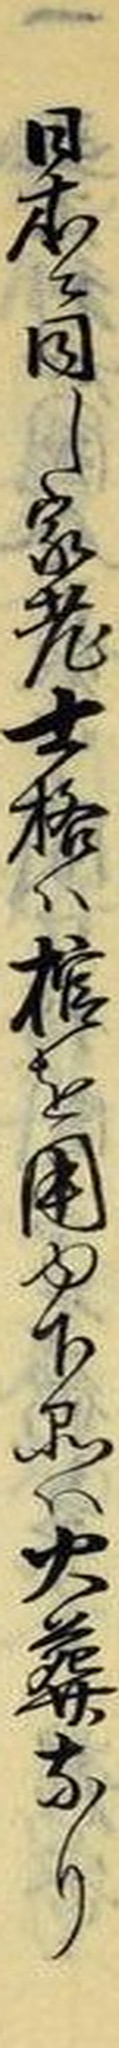日本ニ同し家老士格ハ棺を用ゆ下品ハ火葬なり
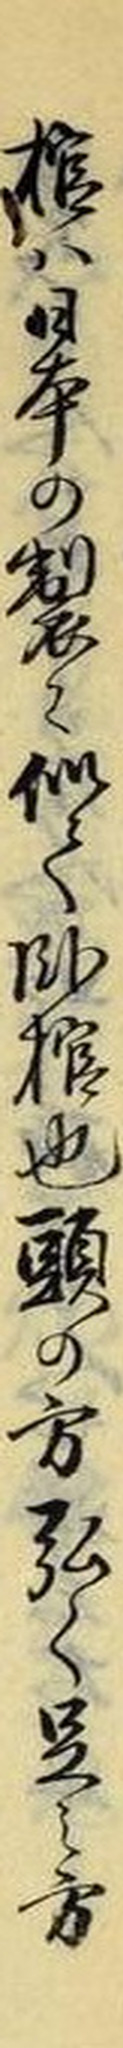棺ハ日本の製ニ似て臥棺也頭の方弘く足之方
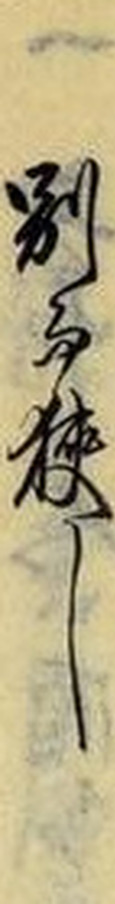別而狭し
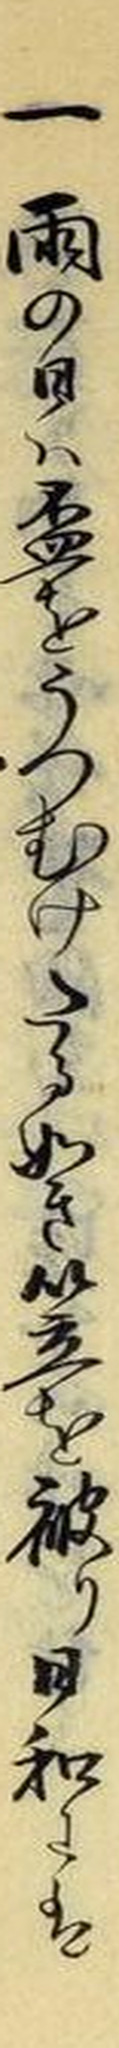一雨の日ハ盆をうつむけたる如き笠を被り日和は
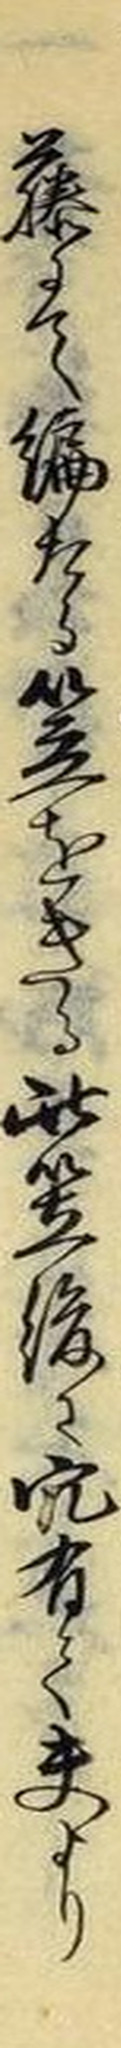籐にて編たる笠をきる此笠後に穴有て夫より
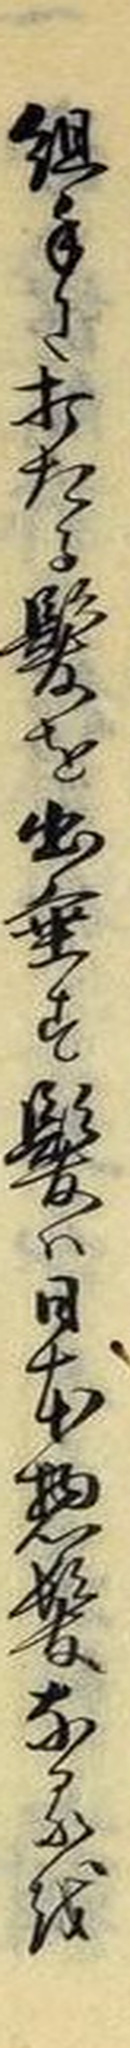組手に折たる髪を出垂す髪ハ日本惣髪なる様を
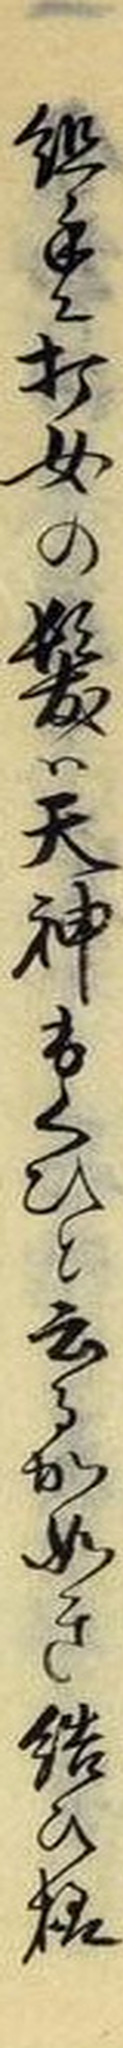組手ニ折女の髪ハ天神もくひと云るが如き結ひ様
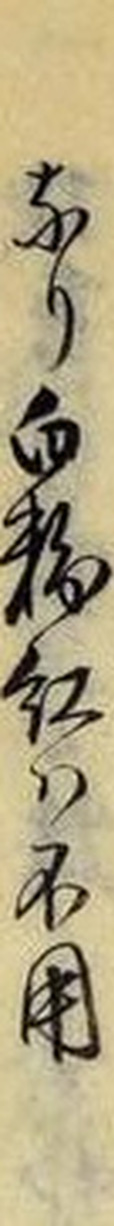なり白粉紅ハ不用
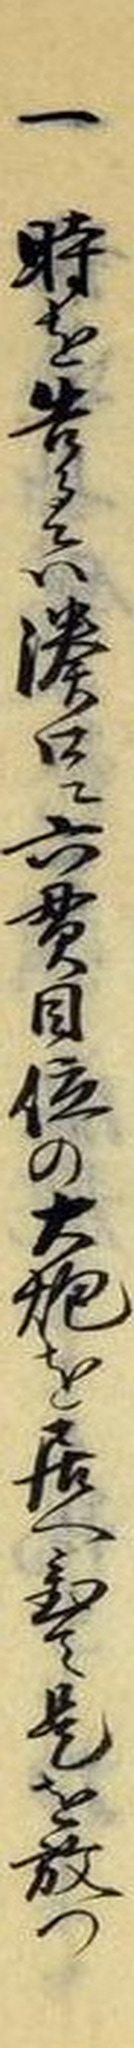一時を告るニハ湊口ニ六貫目位の大砲を据へ置て是を放つ
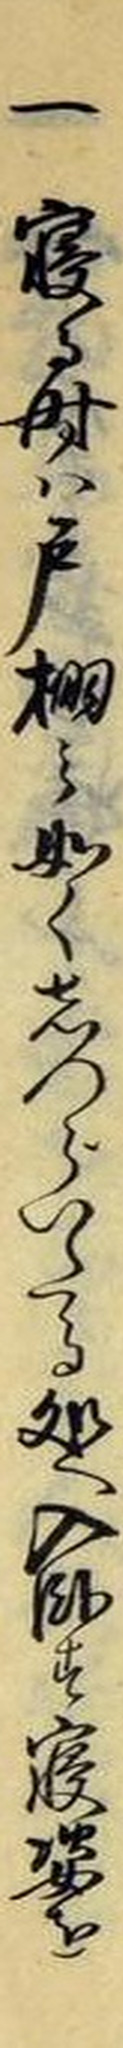一寝る時ハ戸棚の如くしつらいたる処へ入臥す寝姿を

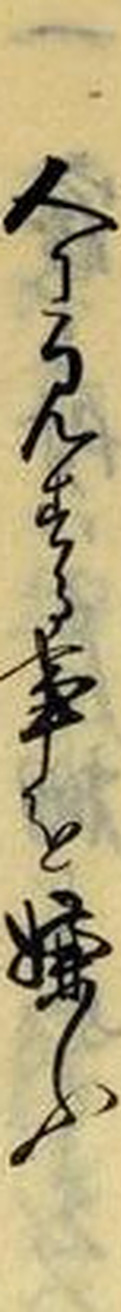人に見する事を嫌ふ
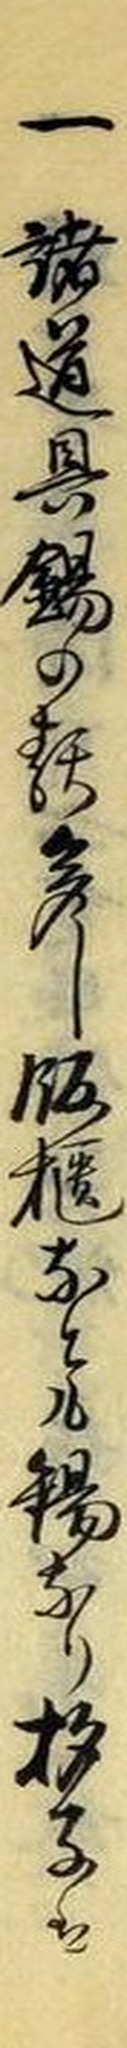一諸道具錫の類多し飯櫃なとも錫なり杓子は
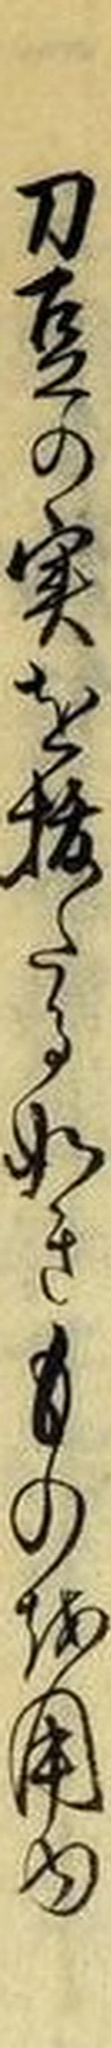刀豆の実を抜たる如きものを用ゆ
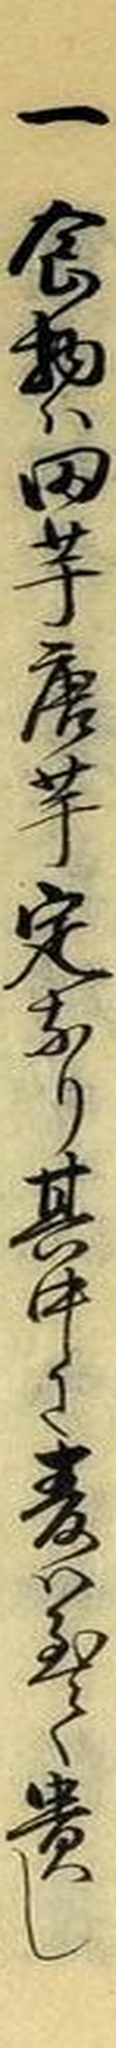一食物ハ田芋唐芋定なり其中に麦ハ至て貴し
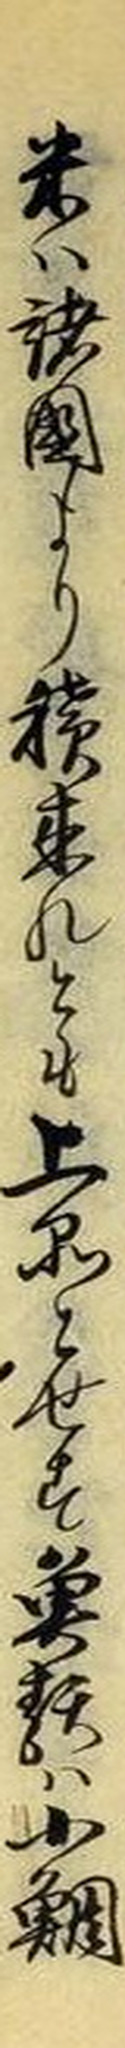米ハ諸国より積来れとも上品とせす魚類ハ小鯛
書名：漂客談奇（備考雑録写8）
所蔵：福井県文書館 Fukui Prefectural Archives
